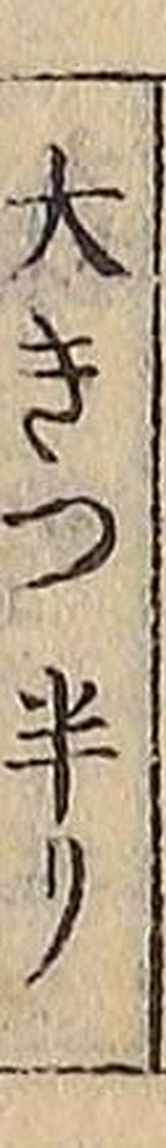大きつ半り
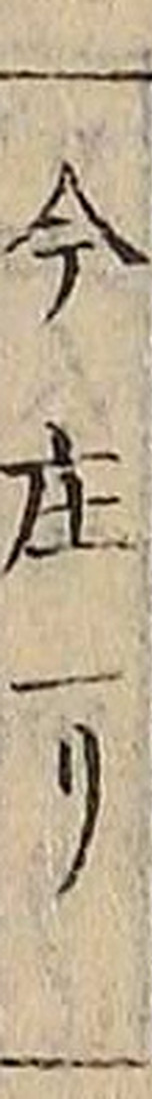今庄一リ
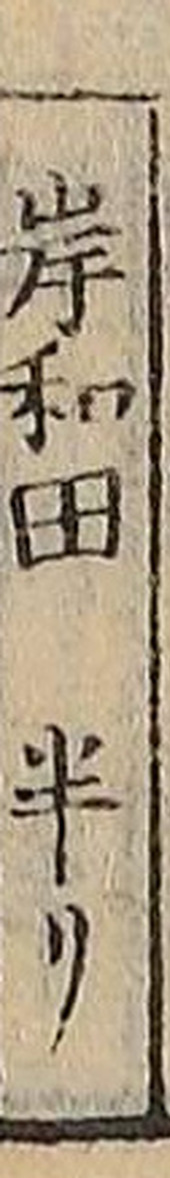岸和田半リ
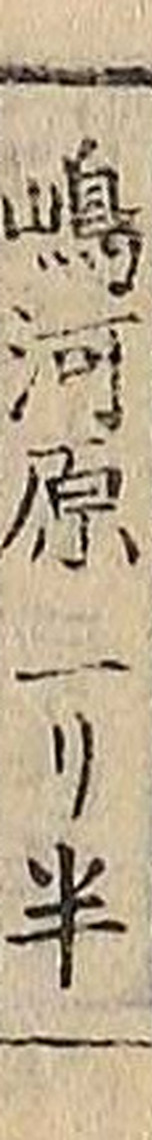島河原一リ半
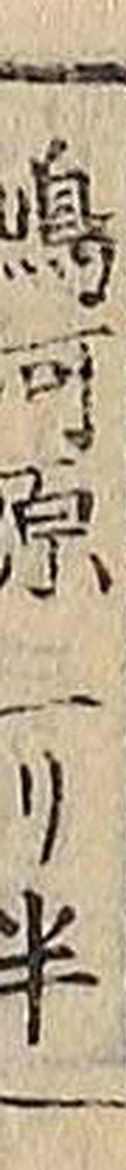島河原一リ半
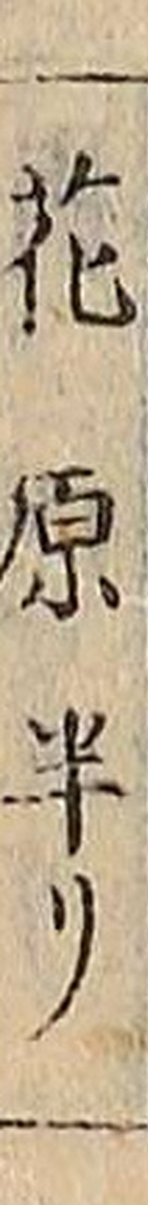花原半り
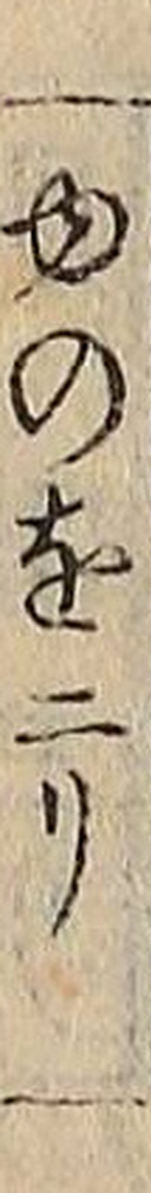ゆのを二リ
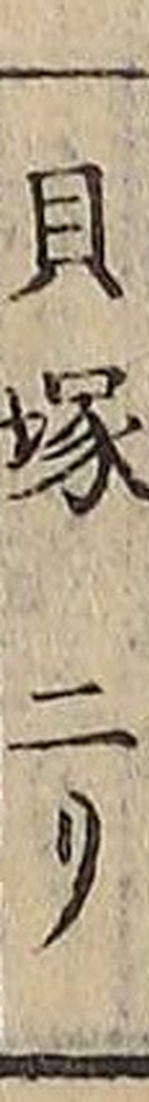貝塚二リ
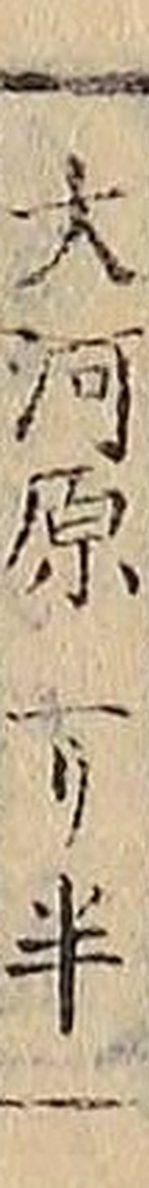大河原一リ半
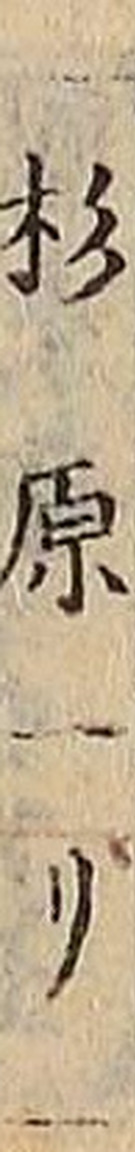杉原一リ
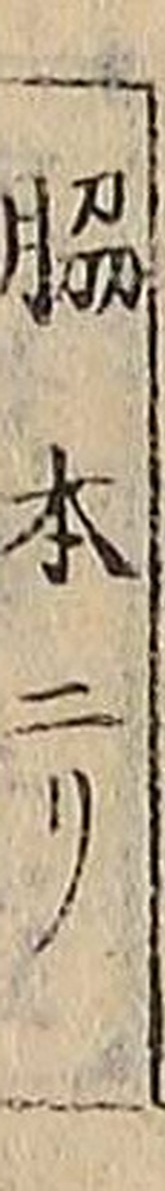脇本二リ
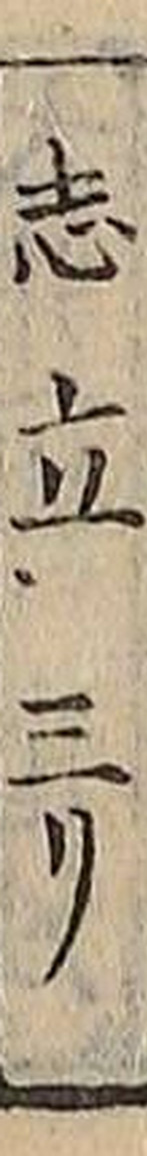志立三リ
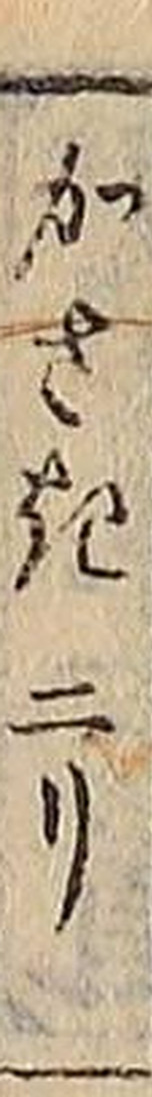かさき二リ
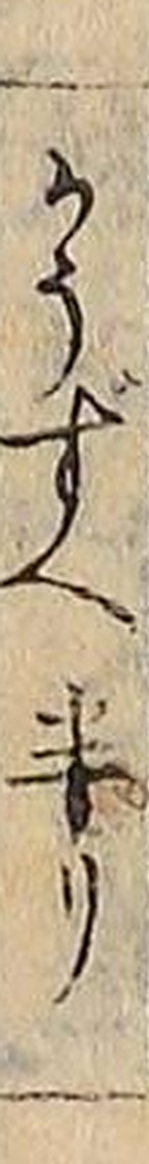かうずへ半リ
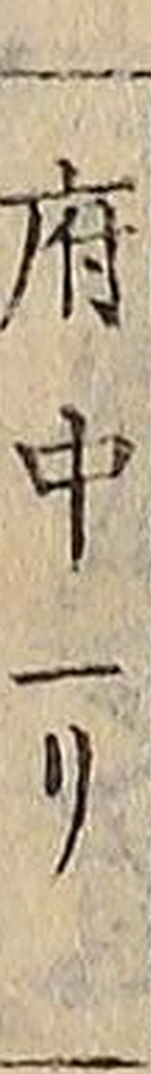府中一リ
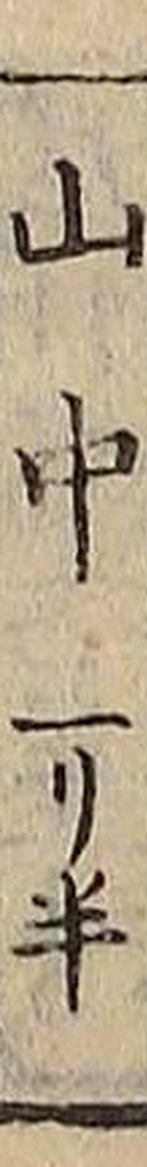山中一リ半
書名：旅行用心集
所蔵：神戸大学附属図書館 国文学研究資料館
